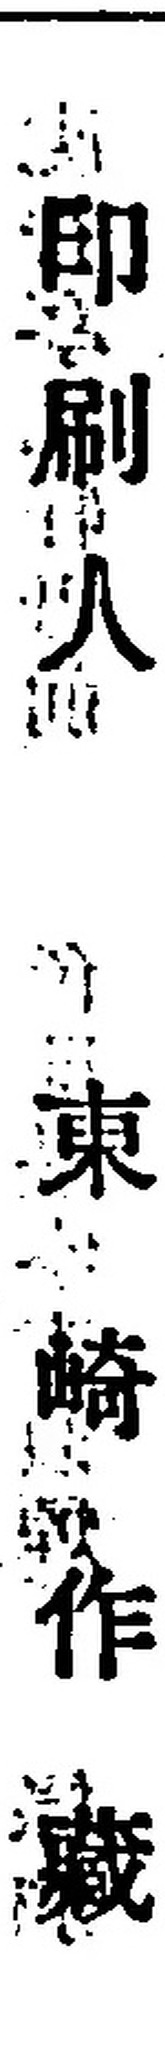印刷人東崎作蔵
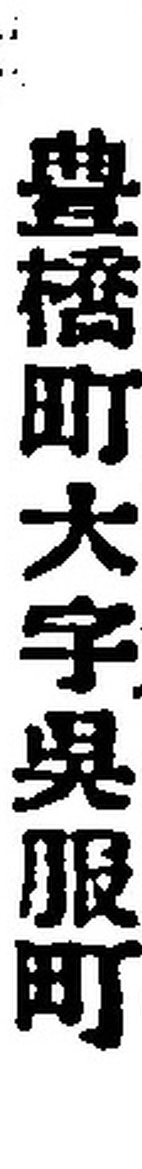豊橋町大字呉服町
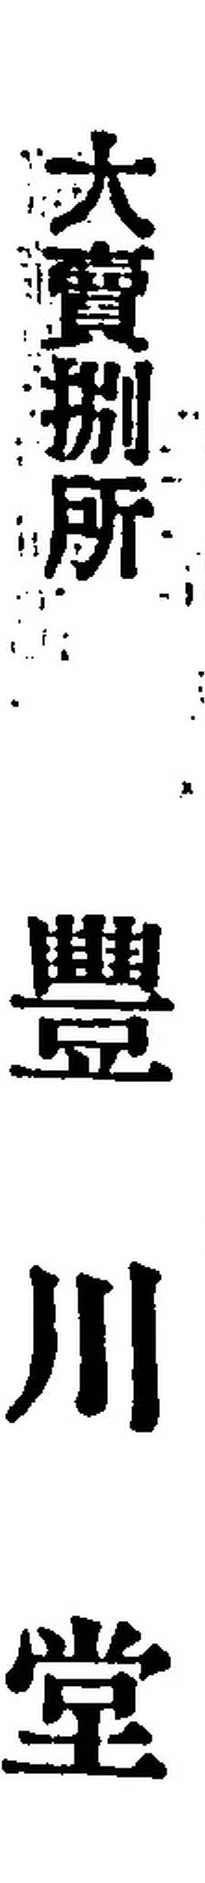大売捌所豊川堂
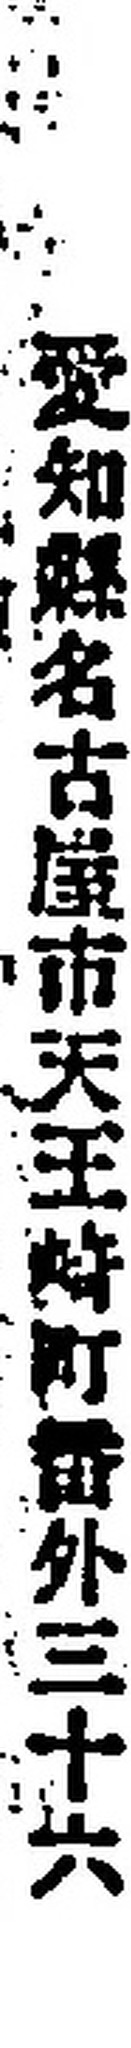愛知県名古屋市天王崎町番外三十六
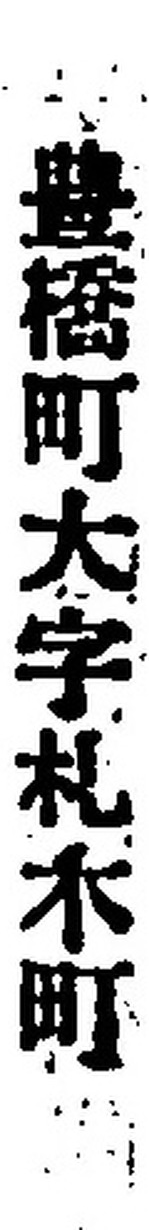豊橋町大字札木町
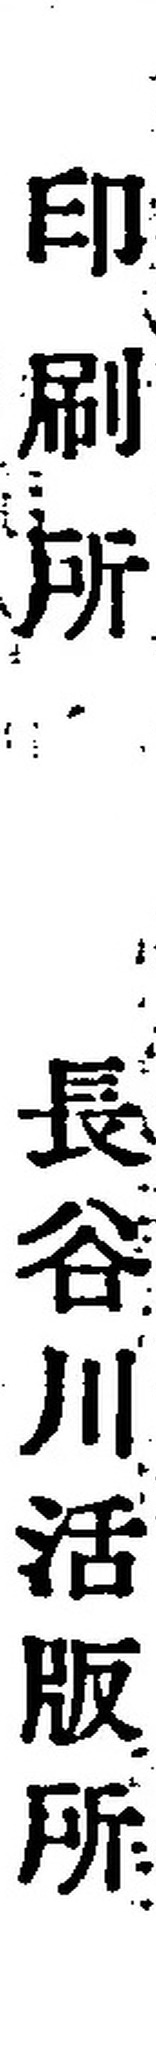印刷所長谷川活版所
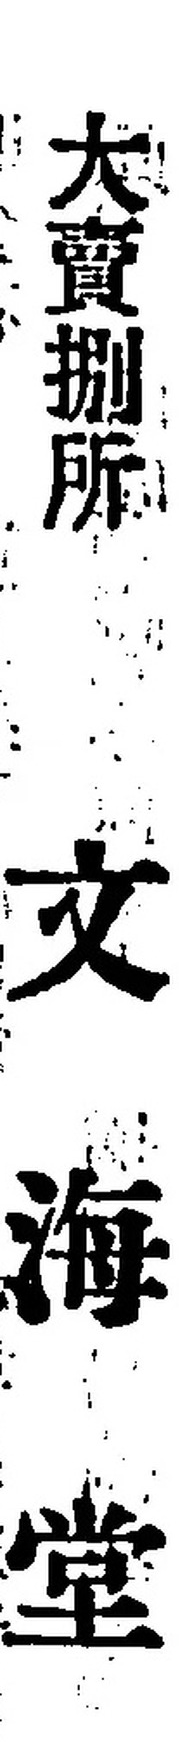大売捌所文海堂

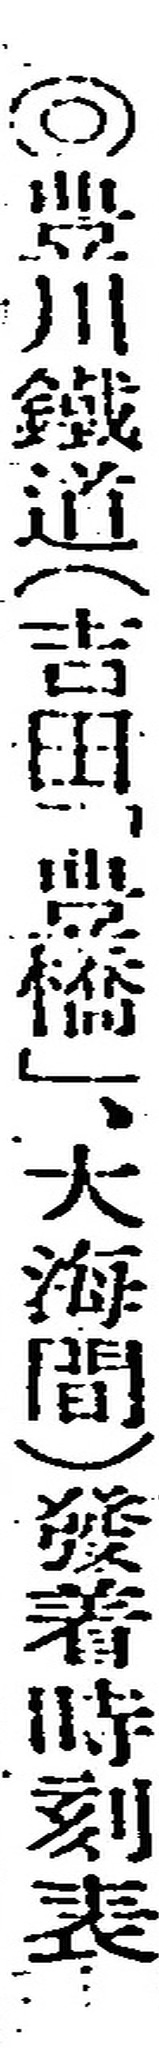◎豊川鉄道(吉田「豊橋」、大海間)発着時刻表
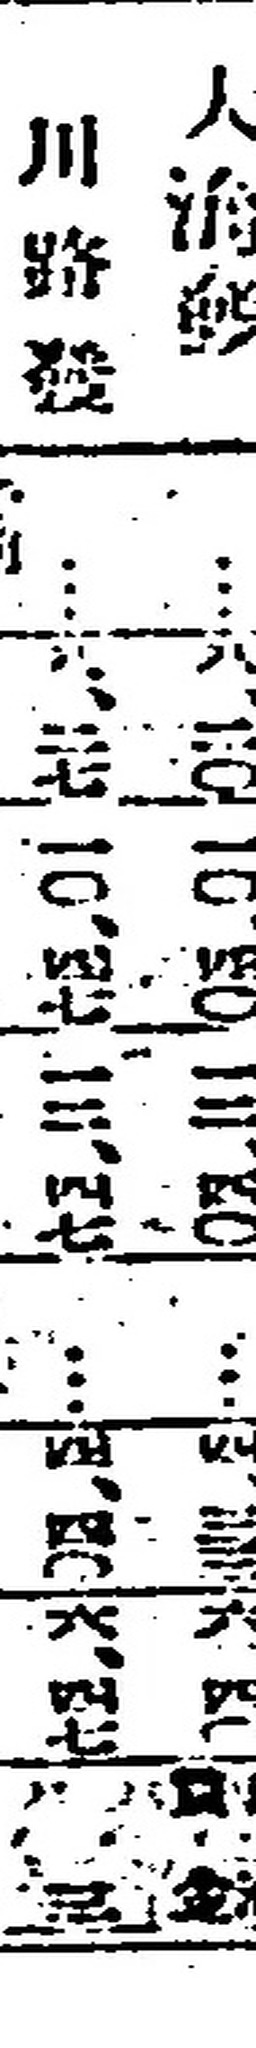川路発…八、二七一〇、四七一二、四七…四、四〇六、四七三
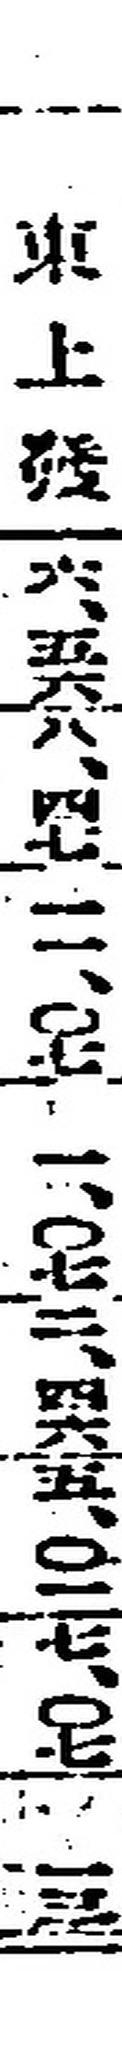東上発六、五六八、四七一一、〇七一、〇七二、四六五、〇一七、〇七一三
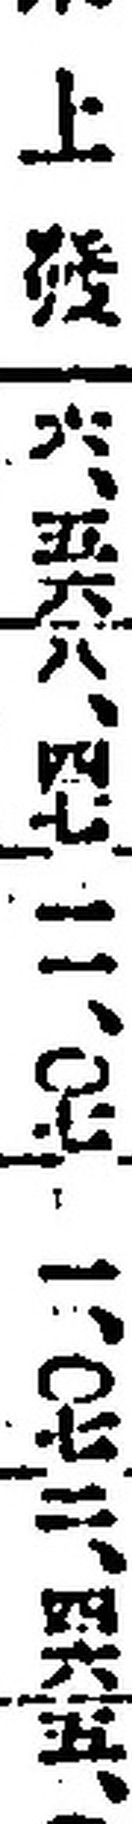東上発六、五六八、四七一一、〇七一、〇七二、四六五、〇一七、〇七一三
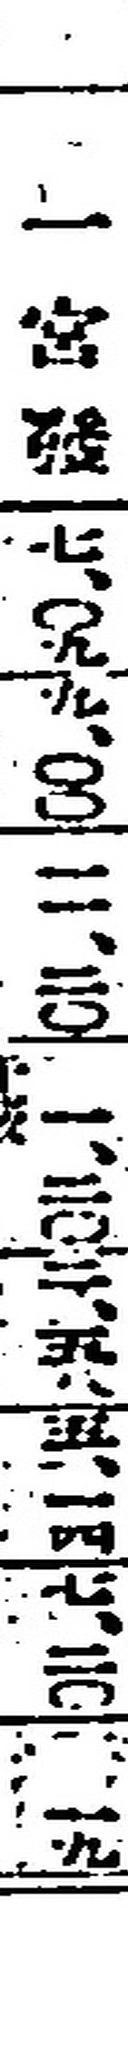一宮発七、〇九九、〇〇一一、二〇一、二〇二、五八五、一四七、二〇一九
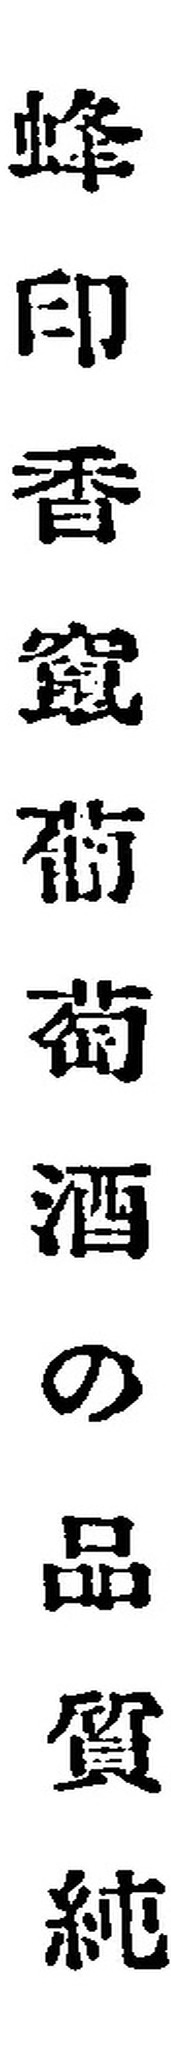蜂印香竄葡萄酒の品質純
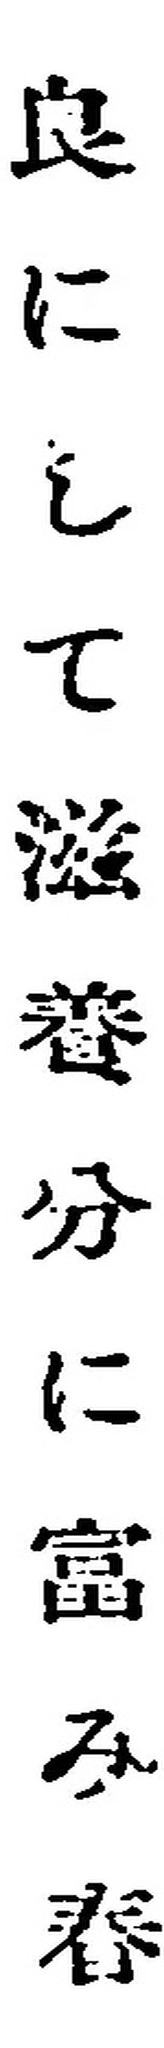良にして滋養分に富み春
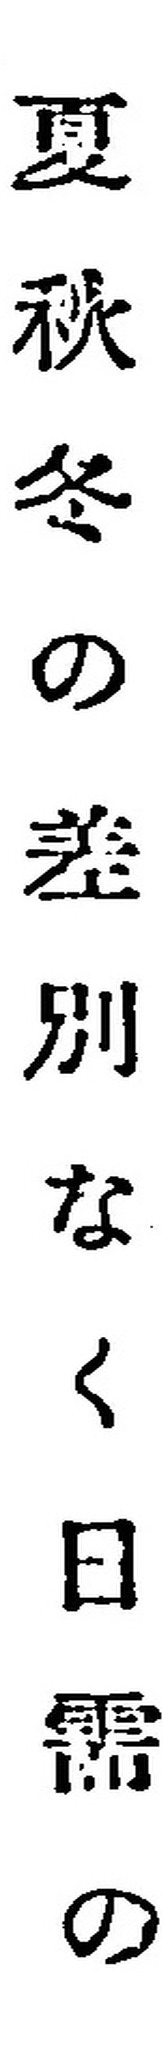夏秋冬の差別なく日需の
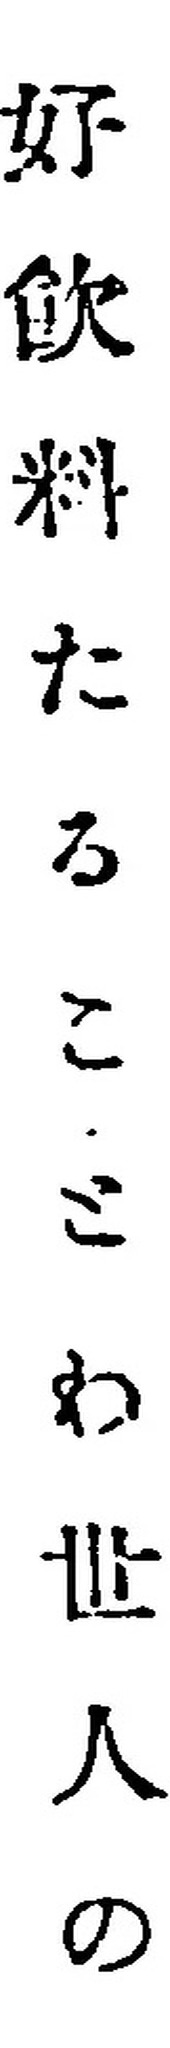好飲料たることわ世人の
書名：東参名勝案内
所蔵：国立国会図書館 National Diet Library, JAPAN
